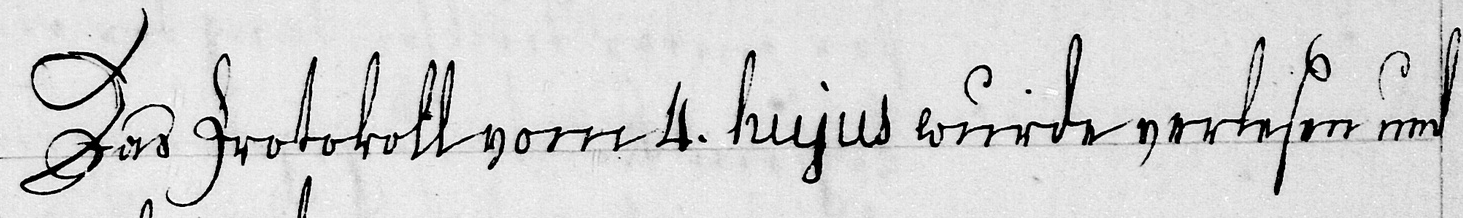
Das Protokoll vom 4. hujus wurde verlesen und
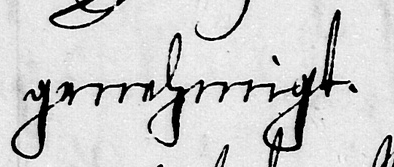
genehmigt.
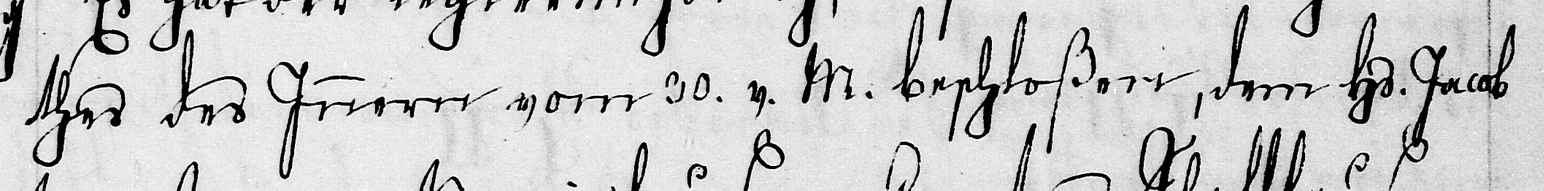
thes des Innern vom 30. v. M. beschloßen, dem Hs. Jacob
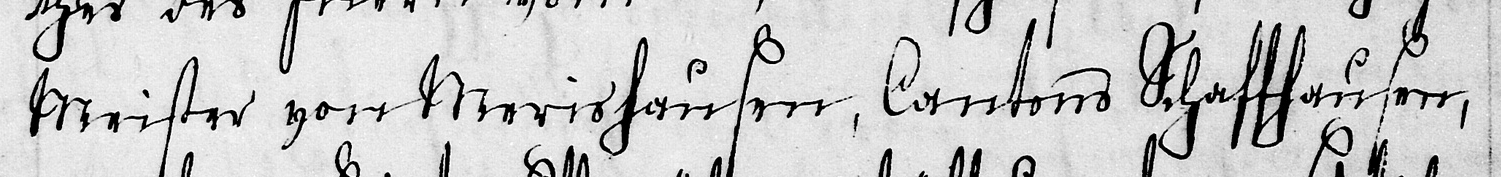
Meister von Merishausen, Cantons Schaffhausen,
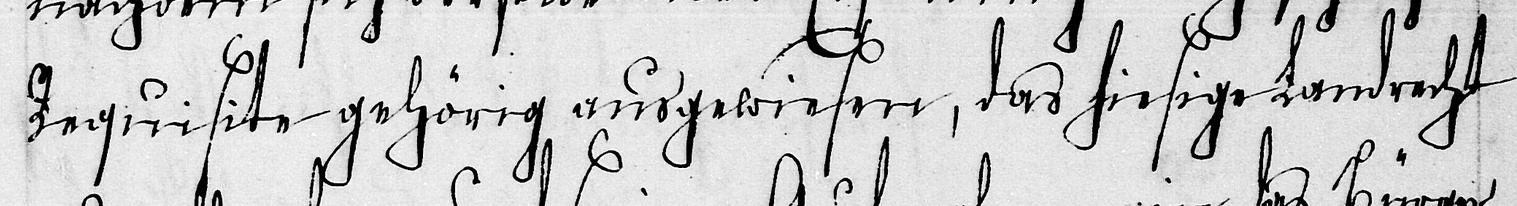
Requisite gehörig ausgewiesen, das hiesige Landrecht
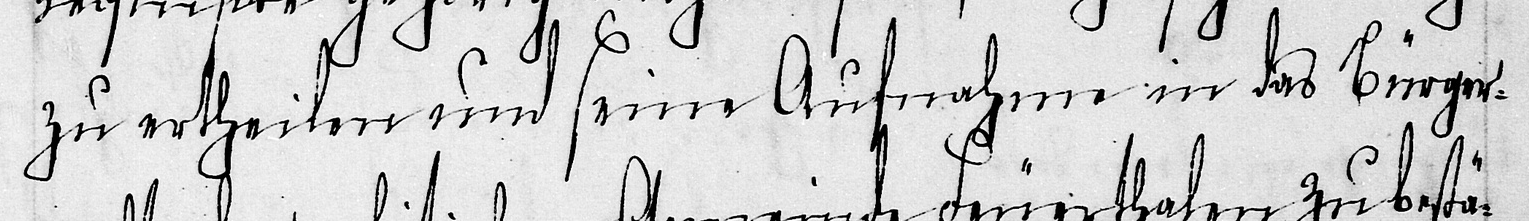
zu ertheilen und seine Aufnahme in das Bürger¬
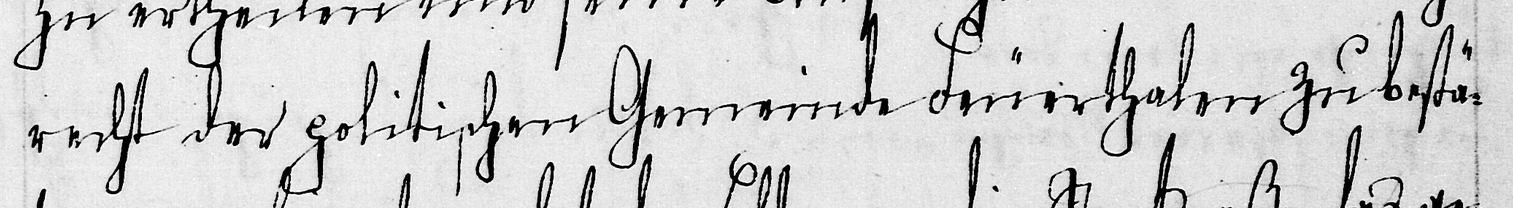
recht der politischen Gemeinde Feuerthalen zu bestä¬
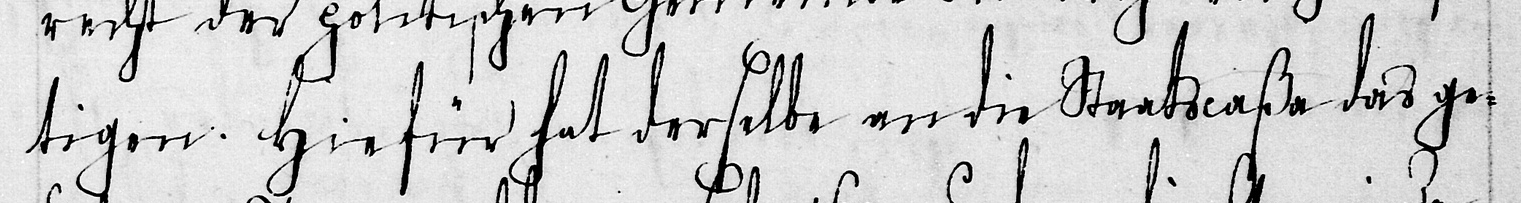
tigen. Hiefür hat derselbe an die Staatscaßa das ges¬
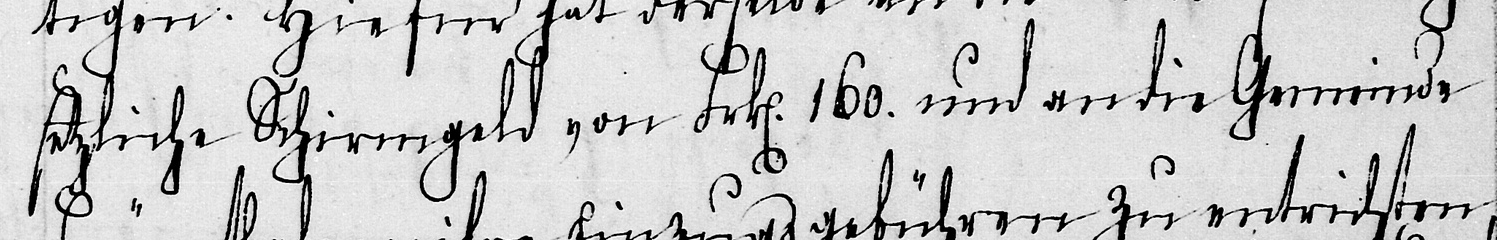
etzliche Schirmgeld von Frk[en]. 160. und an die Gemeinde
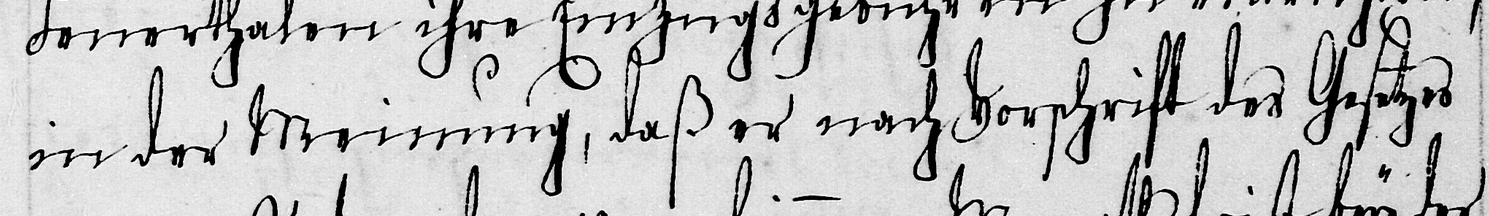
in der Meinung, daß er nach Vorschrift des Gesetzes
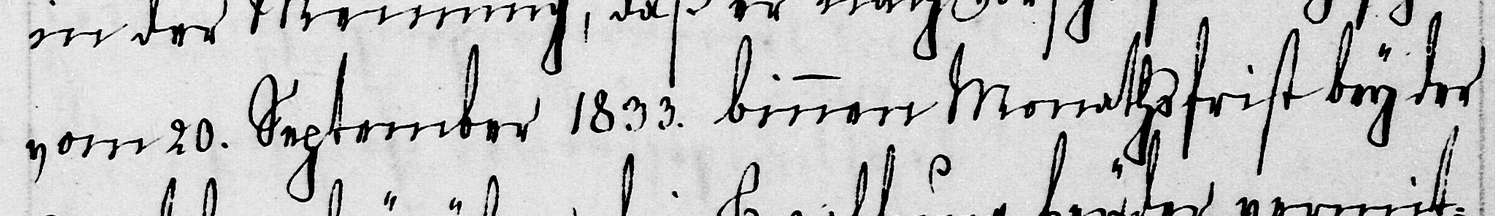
vom 20. September 1833. binnen Monathsfrist bey der
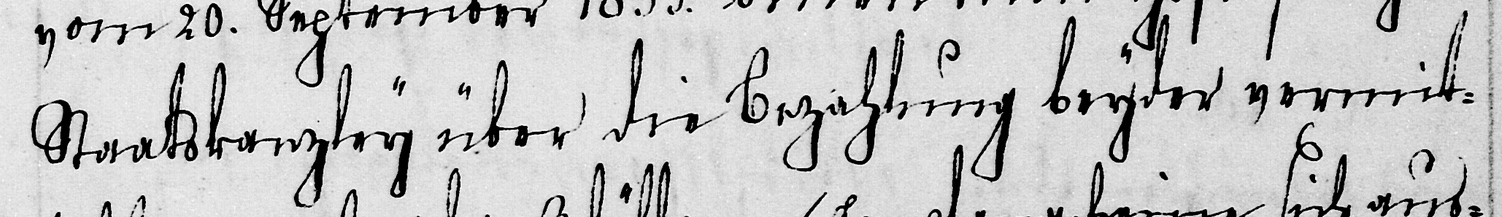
Staatskanzley über die Bezahlung beyder vermit¬
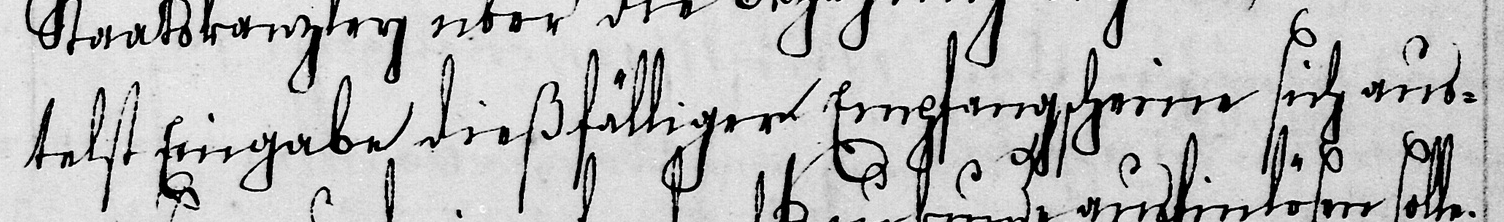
telst Eingabe dießfälliger Empfangscheine sich aus¬
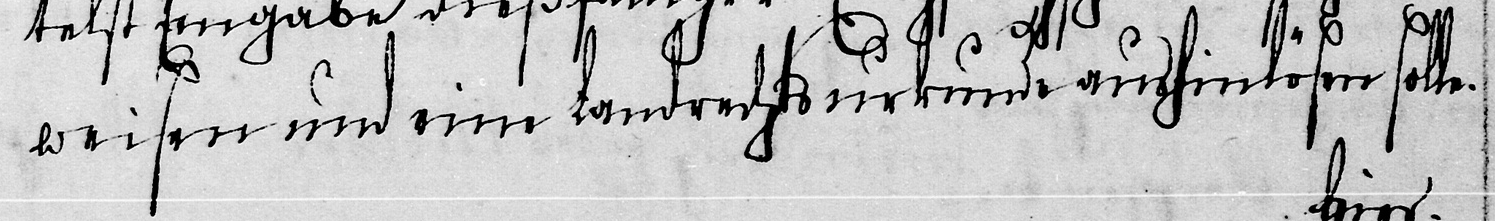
weisen und eine Landrechtsurkunde aushinlösen solle.
